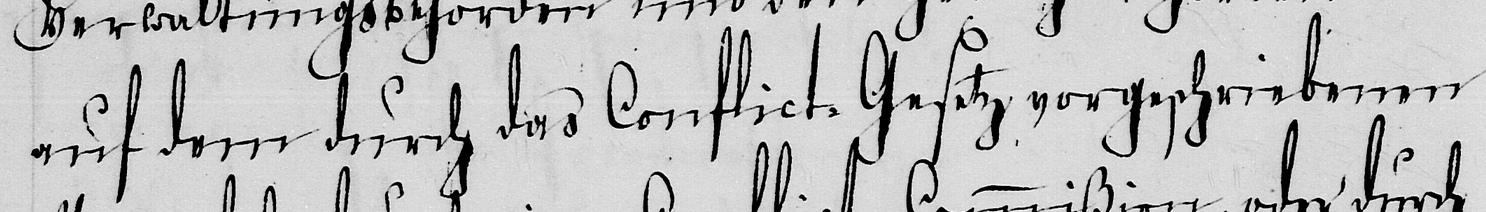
auf dem durch das Conflict-Gesetz vorgeschriebenen
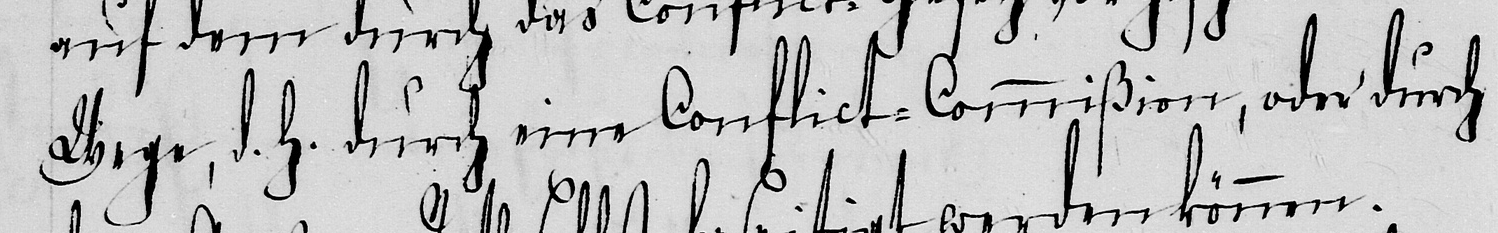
Wege, d. h. durch eine Conflict-Commißion, oder durch
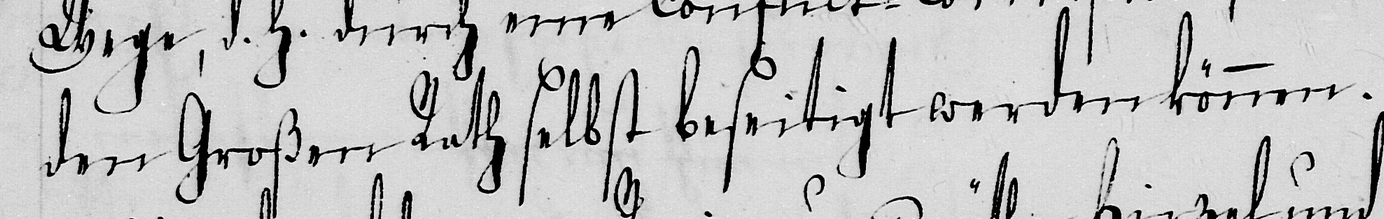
den Großen Rath selbst beseitigt werden können.
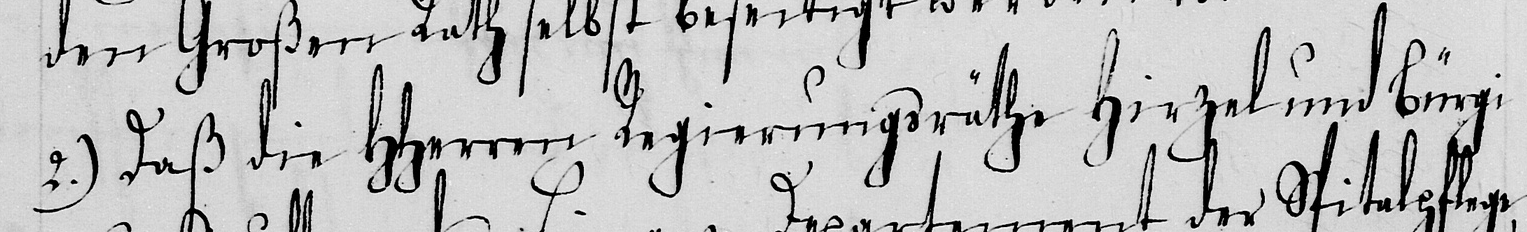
2.) Daß die HHerren Regierungsräthe Hirzel und Bürgi
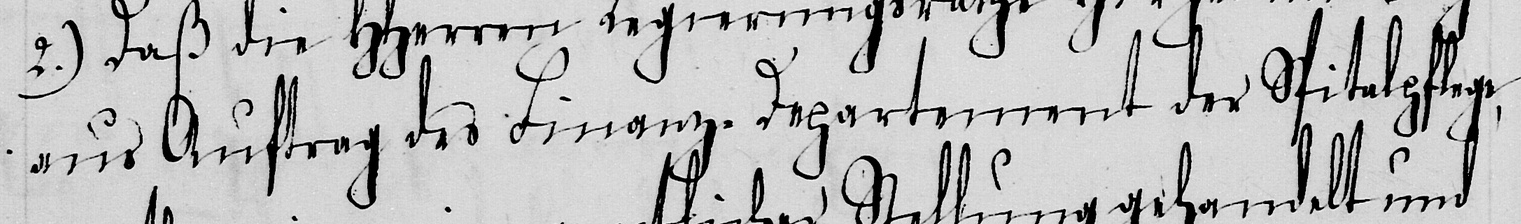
aus Auftrag des Finanz-Departement der Spitalpfleg¬
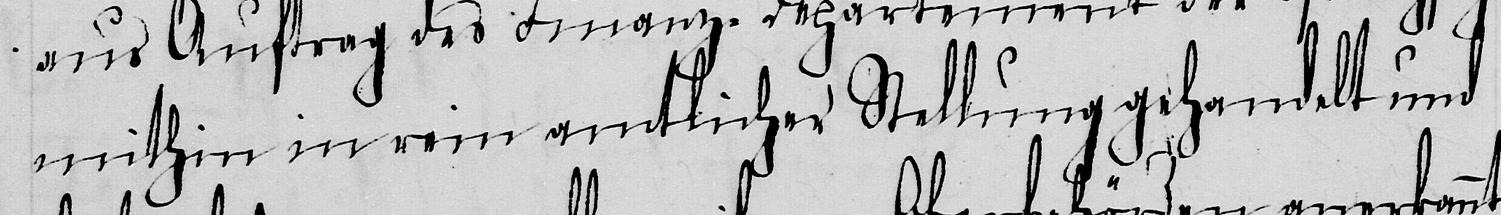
mithin in rein amtlicher Stellung gehandelt und
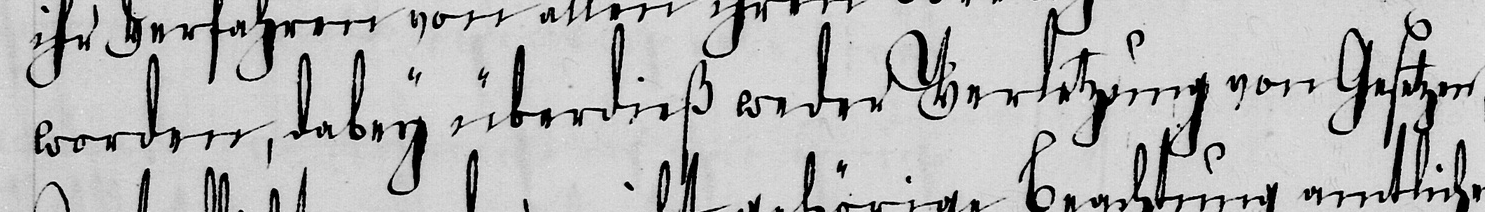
worden, dabey überdieß weder Verletzung von Gesetz¬
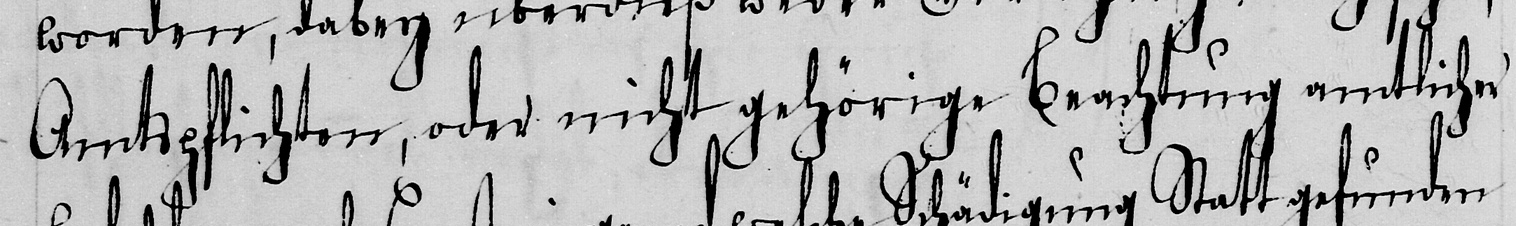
Amtspflichten, oder nicht gehörige Beachtung amtlich¬
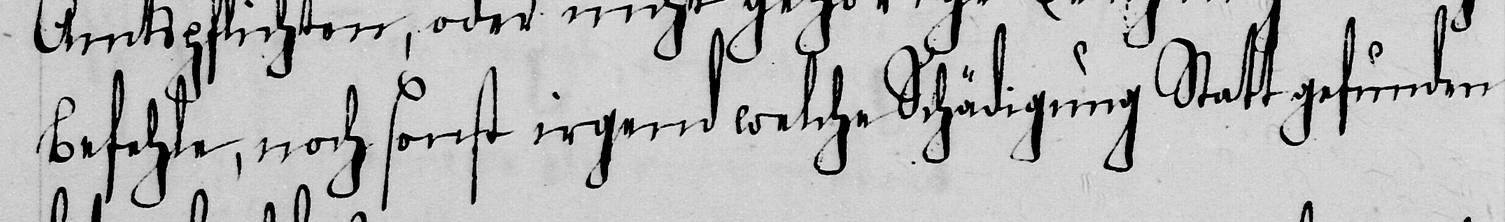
Befehle, noch sonst irgend welche Schädigung Statt gefunden
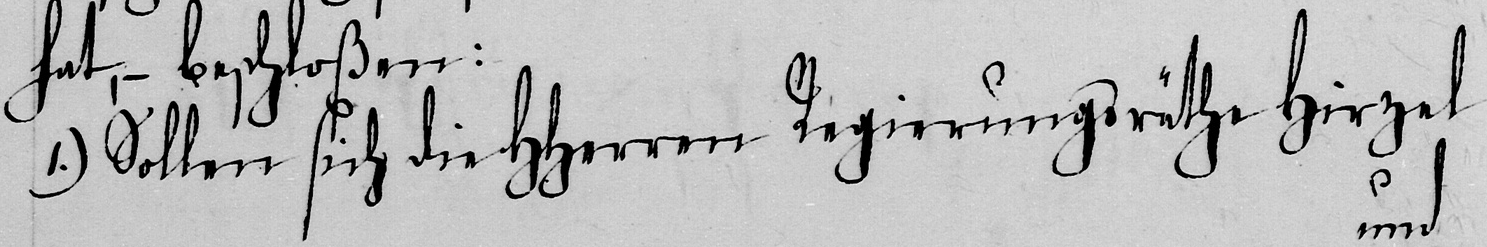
1.) Sollen sich die HHerren Regierungsräthe Hirzel
